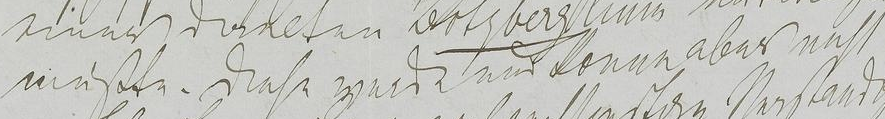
müßte. Diese werde und könne aber nicht
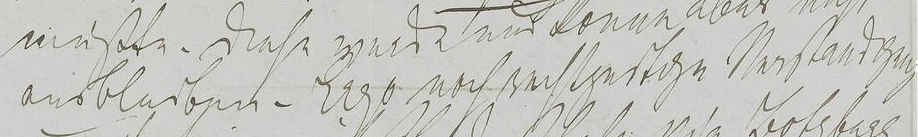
ausbleiben. Ergo noch rechtzeitige Verständigung
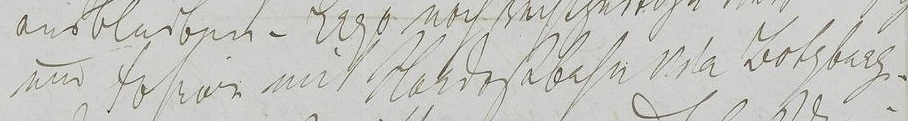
und Fusion mit Nordostbahn via Bötzberg.
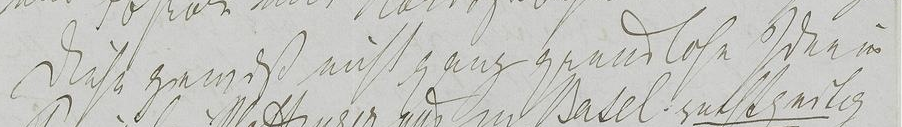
Diese gewiß nicht ganz grundlose Idee in
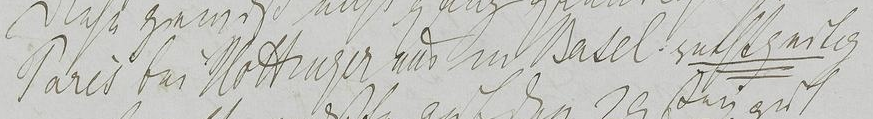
Paris bei Hottinger und in Baselrechtzeitig
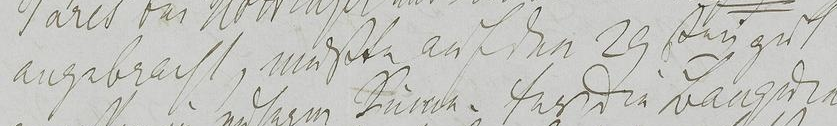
angebracht, müßte auf den 29sten gut
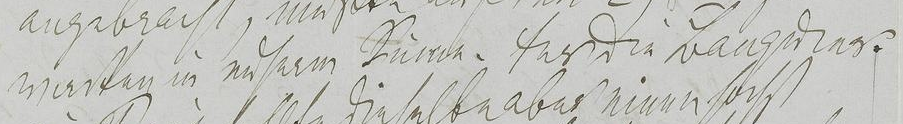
wircken in unserm Sinne. Für die Banquiers
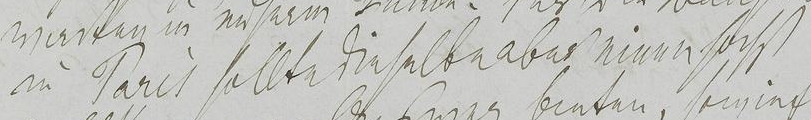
in Paris sollte dieselbe aber einen höchst
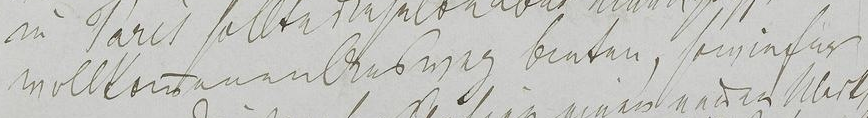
willkommenen Ausweg bieten, sowie für
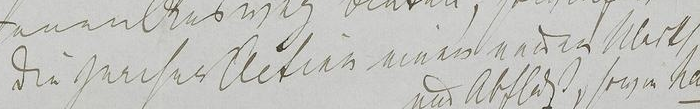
die zürcher Actien einen neuen Markt
